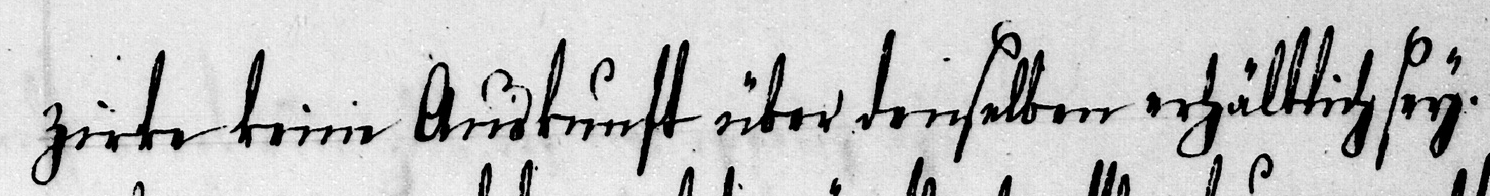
zirke keine Auskunft über denselben erhältlich sey.
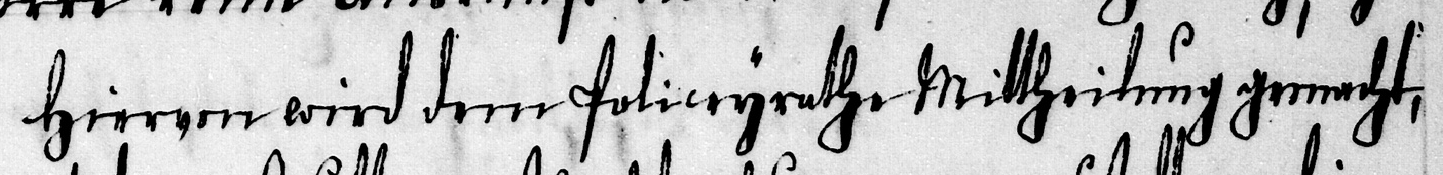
Hiervon wird dem Policeyrathe Mittheilung gemacht,
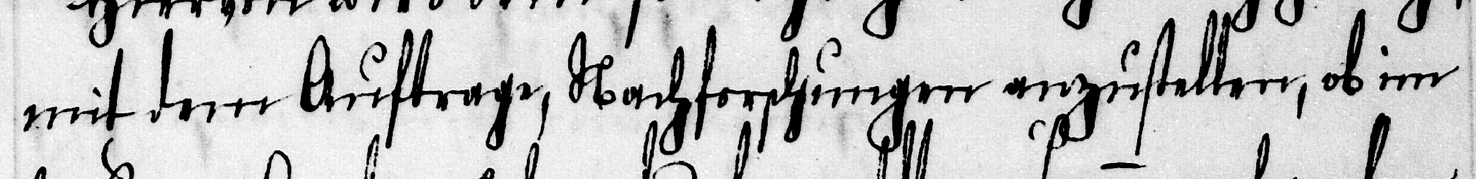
mit dem Auftrage, Nachforschungen anzustellen, ob im
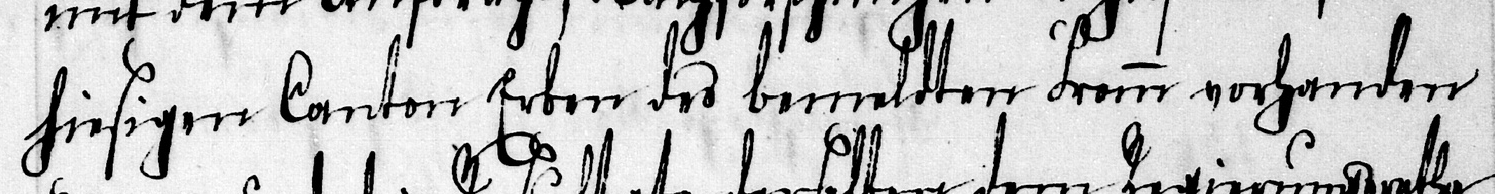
hiesigen Canton Erben des bemeldten Fromm vorhanden
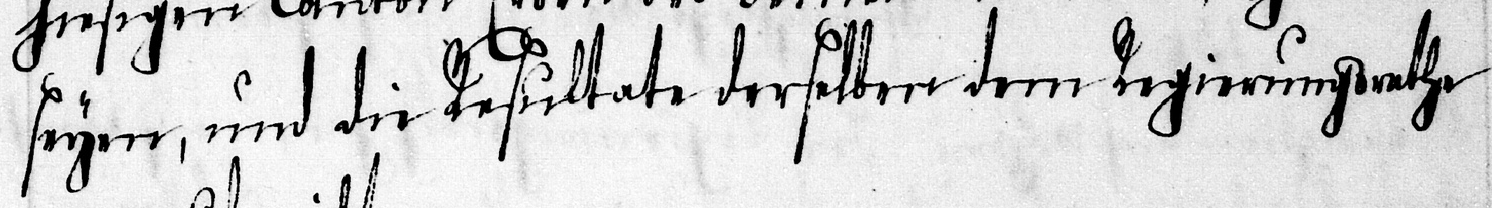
seyen, und die Resultate derselben dem Regierungsrathe
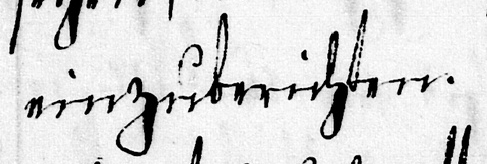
einzuberichten.
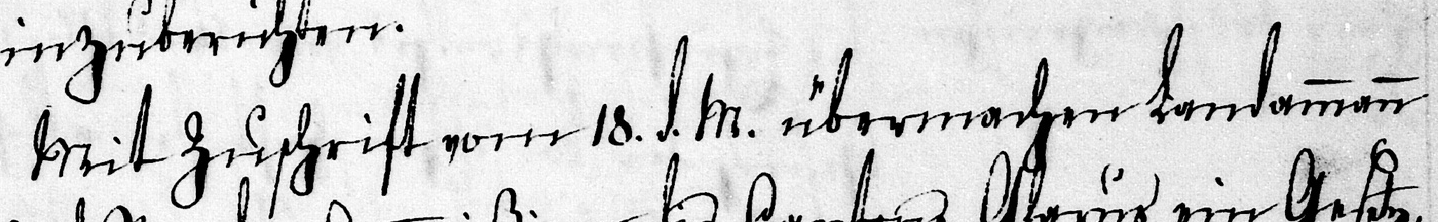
Mit Zuschrift vom 18. d. M. übermachen Landammann
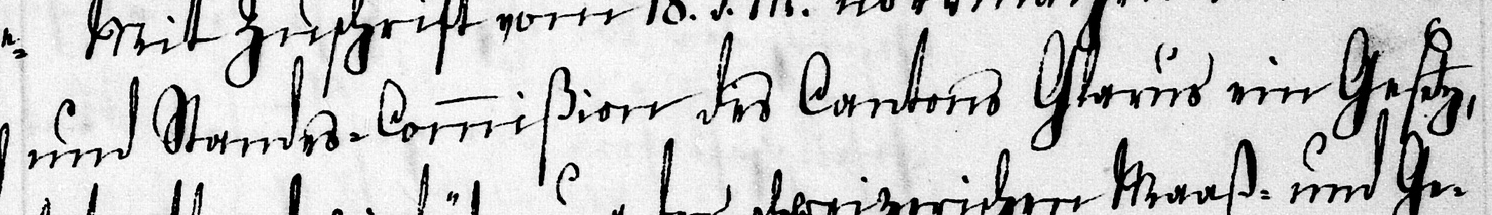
und Standes-Commißion des Cantons Glarus ein Gesetz,
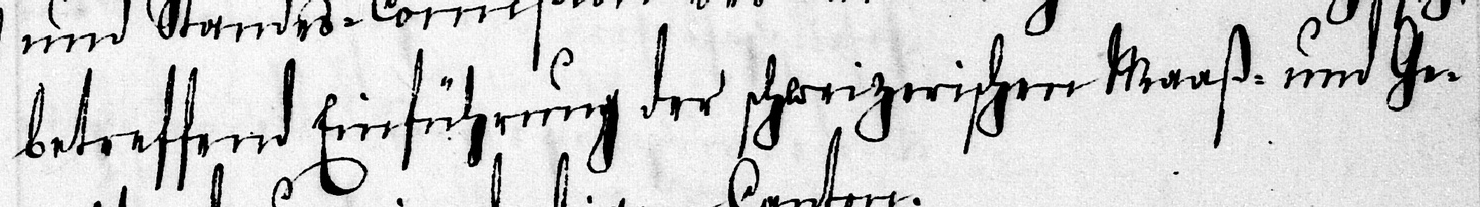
betreffend Einführung der schweizerischen Maaß- und Ge¬
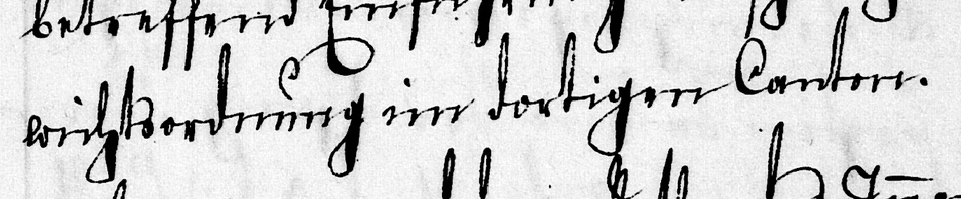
wichtsordnung im dortigen Canton.
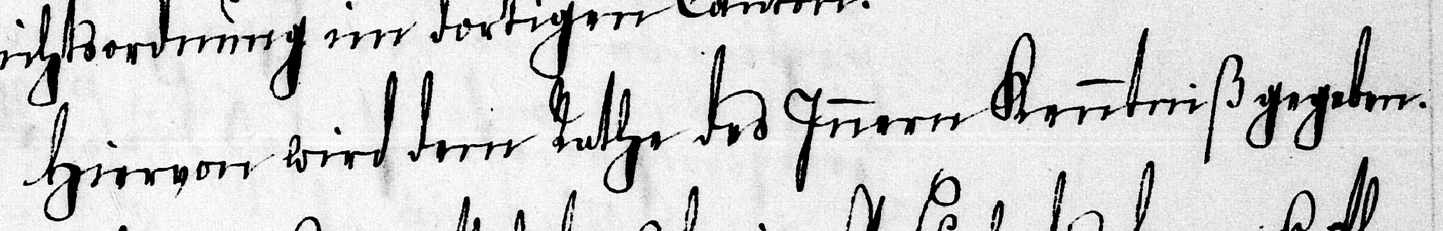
Hiervon wird dem Rathe des Innern Kenntniß gegeben.
